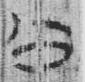公
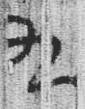九
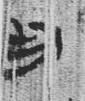出
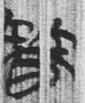○（孰）
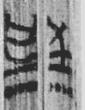爲
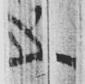之
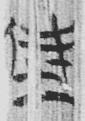○（封）
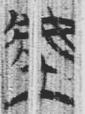○（吾）
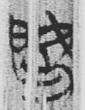既
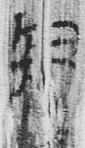長
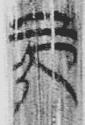而
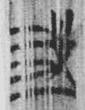或（又）
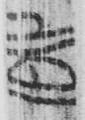老
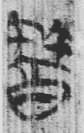○（孰）
